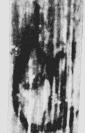臣
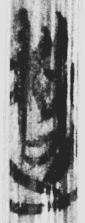楚
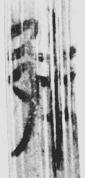邦
